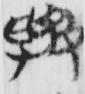與
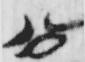公
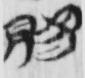賜
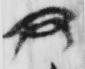尹
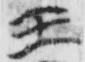王
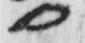厶（私）
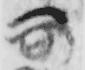司
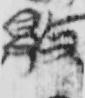敗
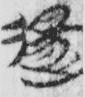逿
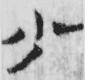少
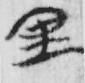里
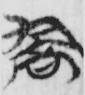喬
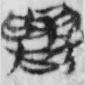與
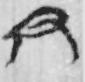尹
